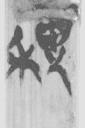{禾田儿}
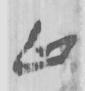㠯（以）
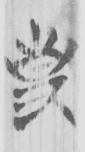吏
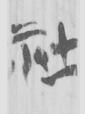社
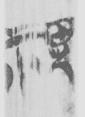{示田儿}
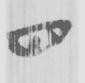四
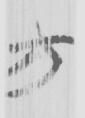方
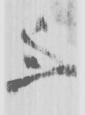之
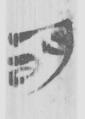明
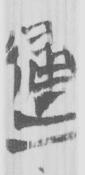歸
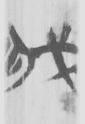我
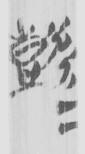彭=
